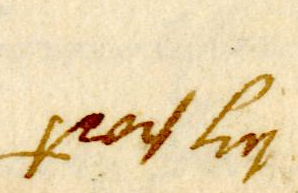By Post
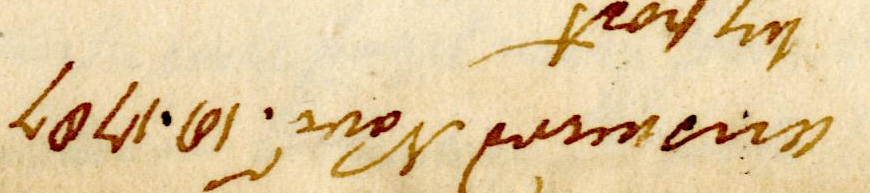Answered Nov^r 10 1787
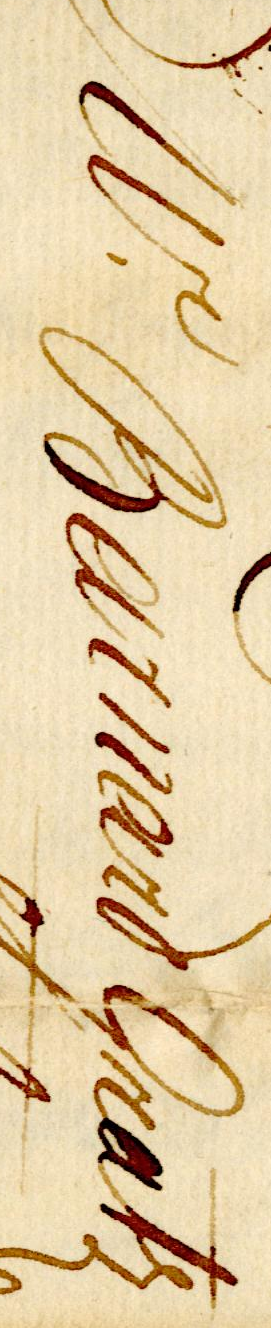M^r Barnard Gratz
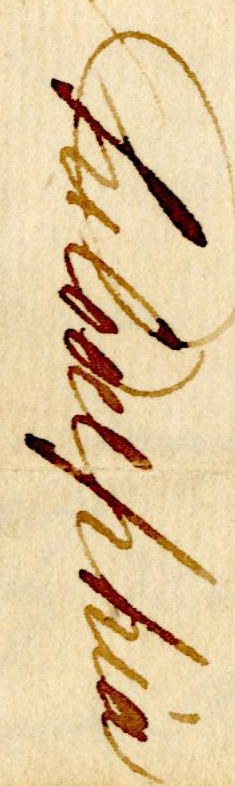Philadelphia
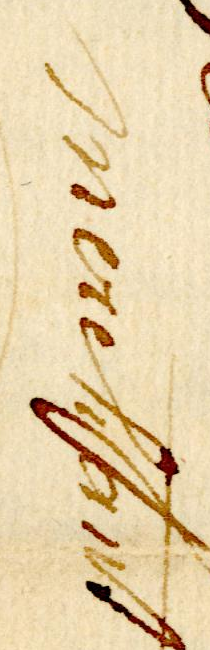Merchant
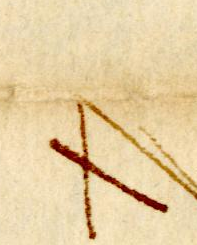4
